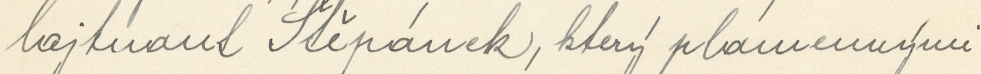lajtnant Štěpánek, který plamennými
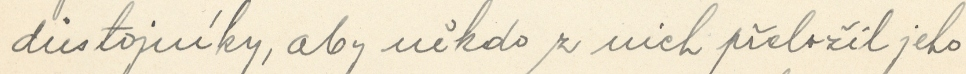důstojníky, aby někdo z nich přeložil jeho
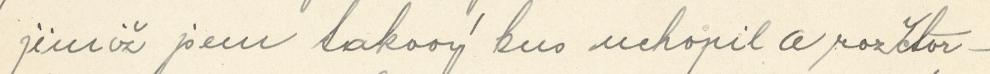jimiž jsem takový kus uchopil a rozčtvr-
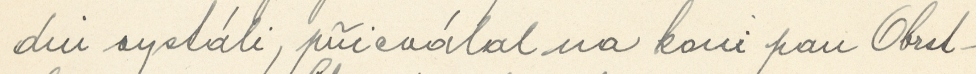din vystáli, přicválal na koni pan Obrst-
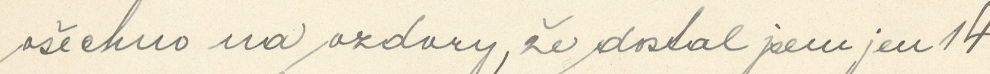všechno na vzdory, že dostal jsem jen 14
